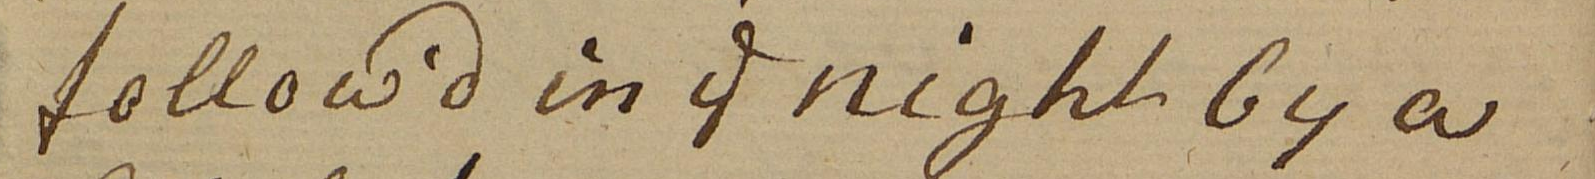follow'd in y^e night by a
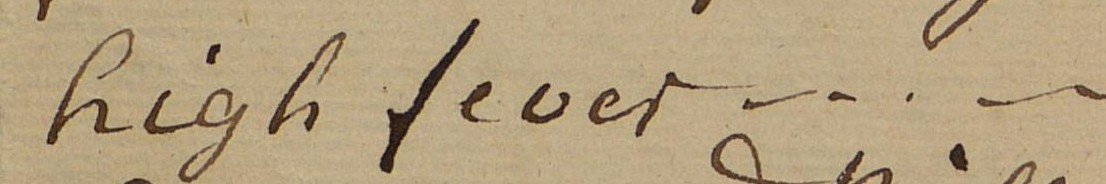high fever-..-
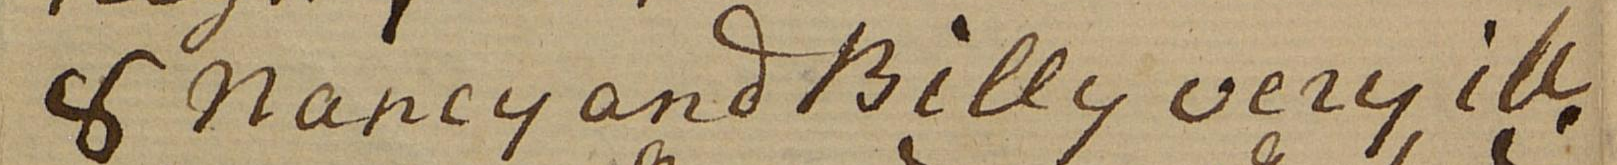8 Nancy and Billy very ill
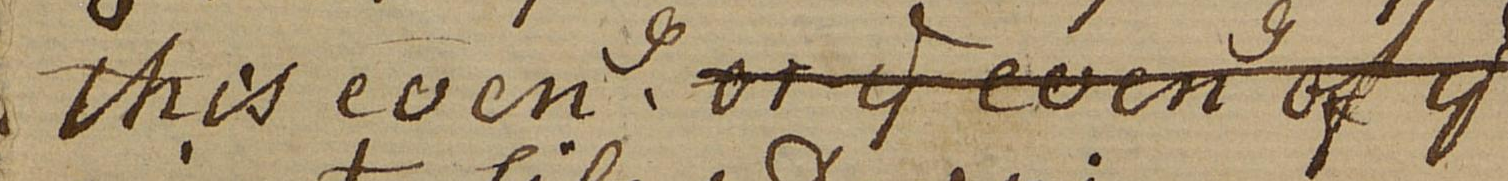this even^g. or y^e even^g of y^e
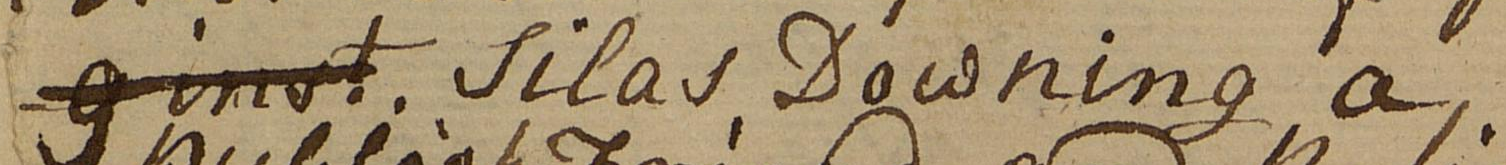[9 ins^t.] Silas Downing a
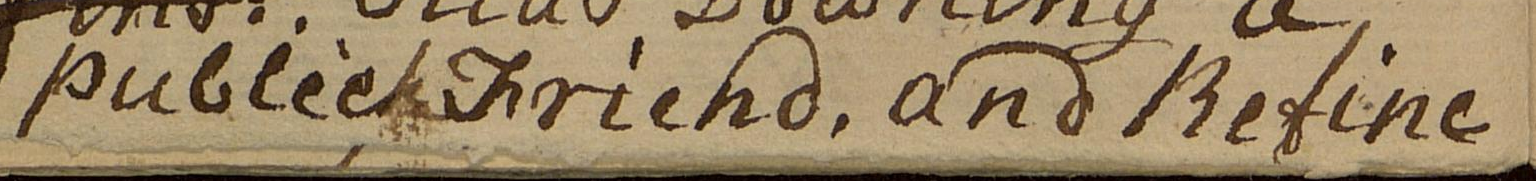publick Friend, and Refine
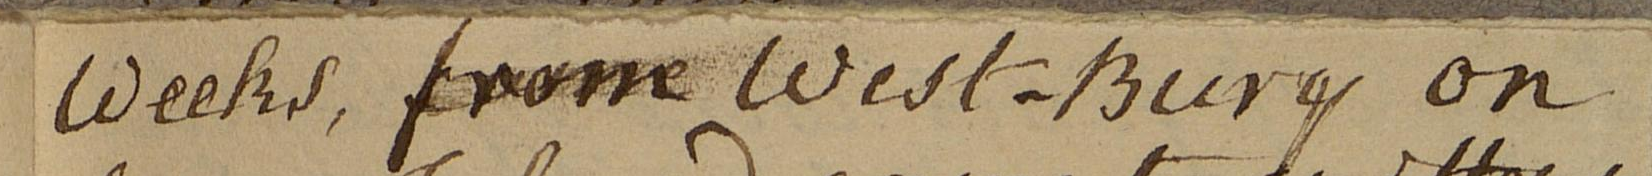Weeks, from West-Bury on
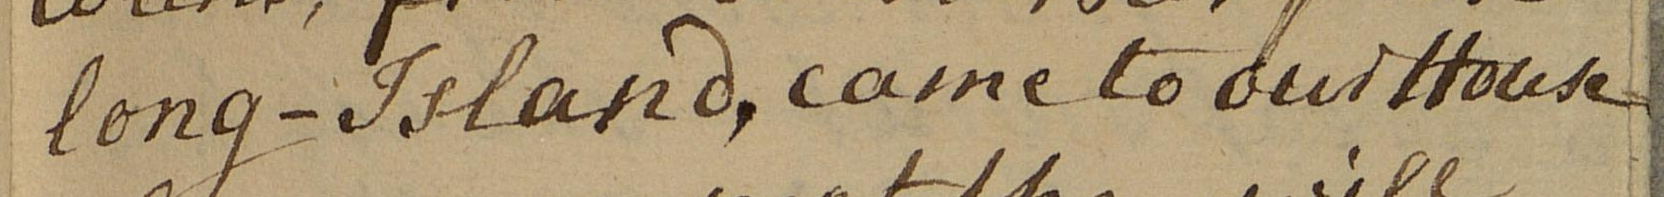long-Island, came to our House
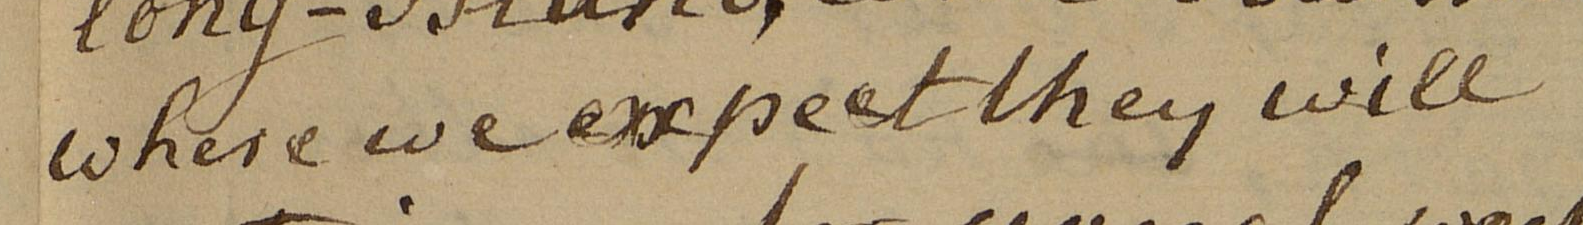where we expect they will
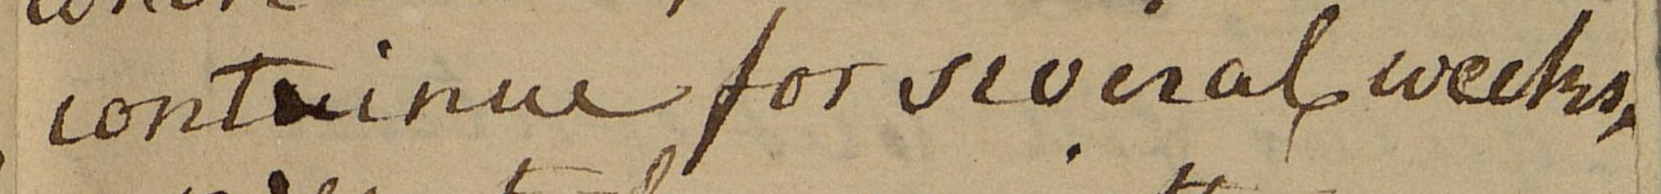contuinue for several weeks
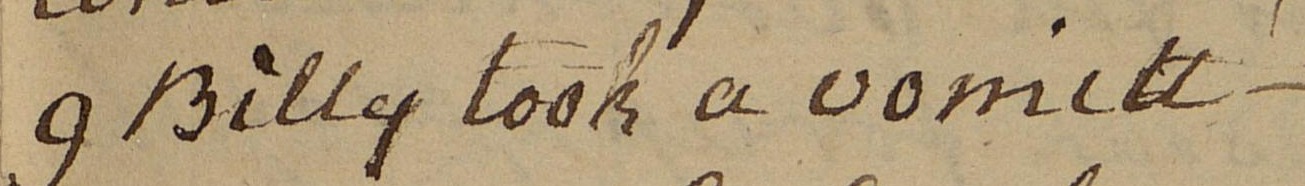9 Billy took a vomitt-
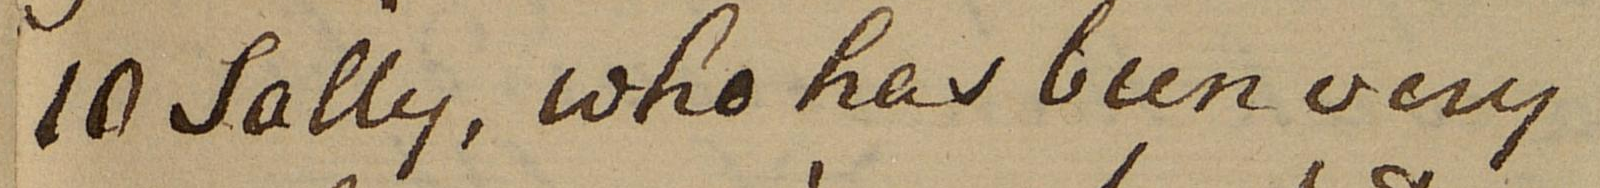10 Sally, who has been very
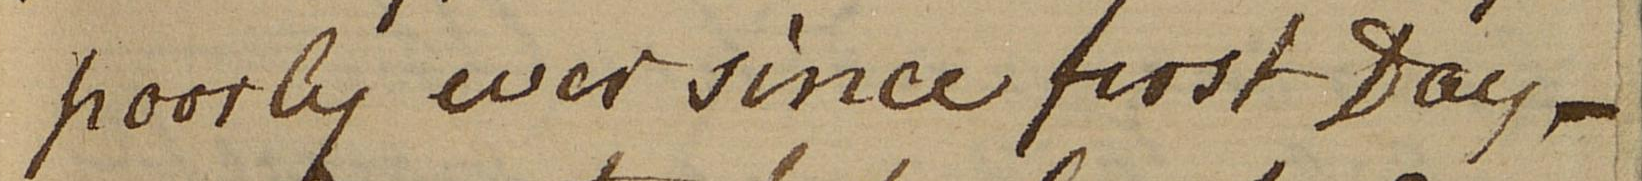poorly ever since [frost] Day-
